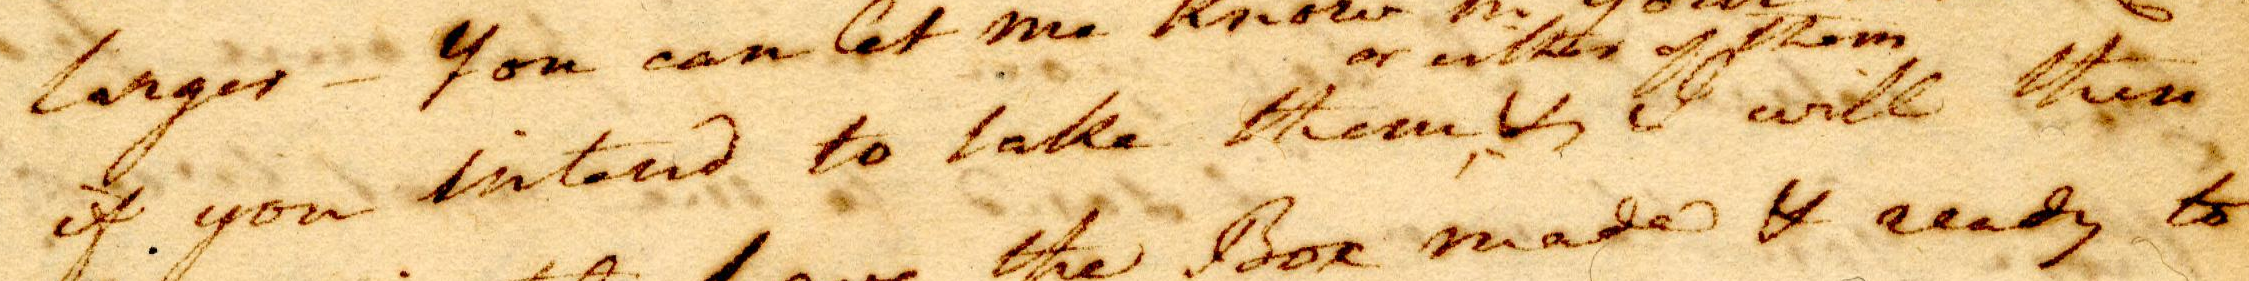if you intend to take them ^ & I will then
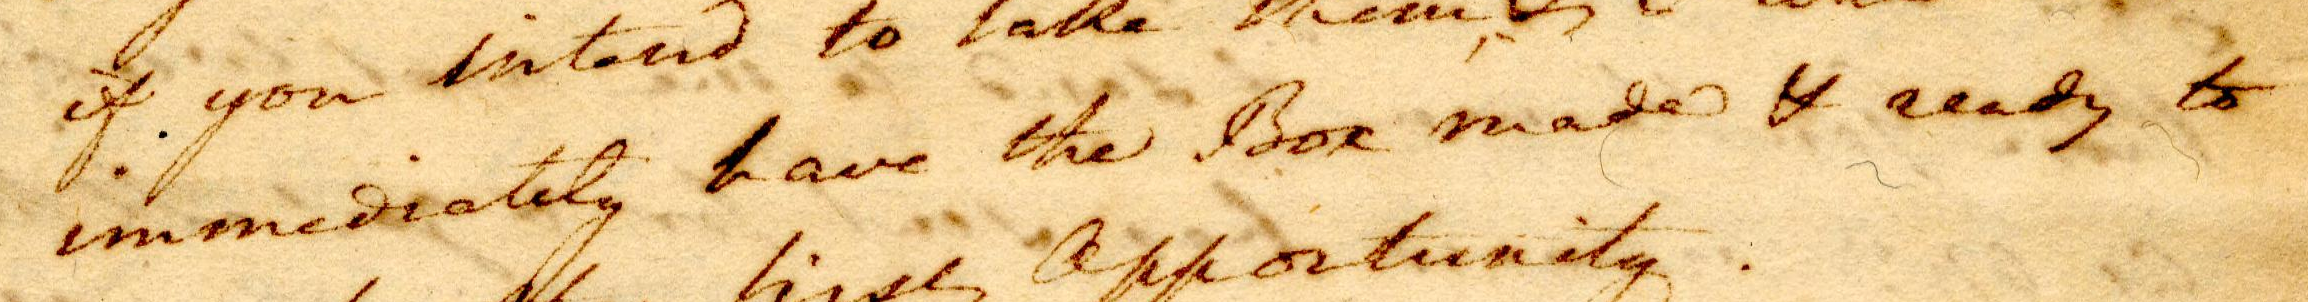immediately have the Box made & ready to
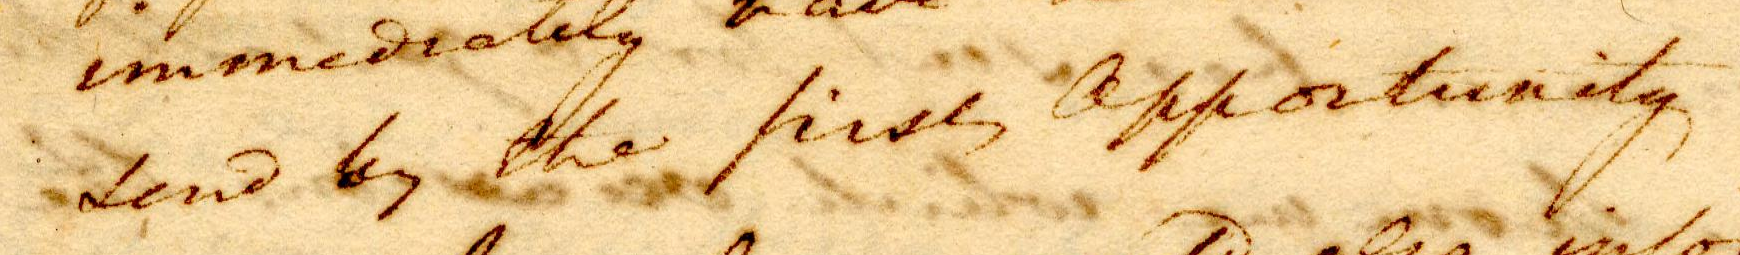send by the first Opportunity.
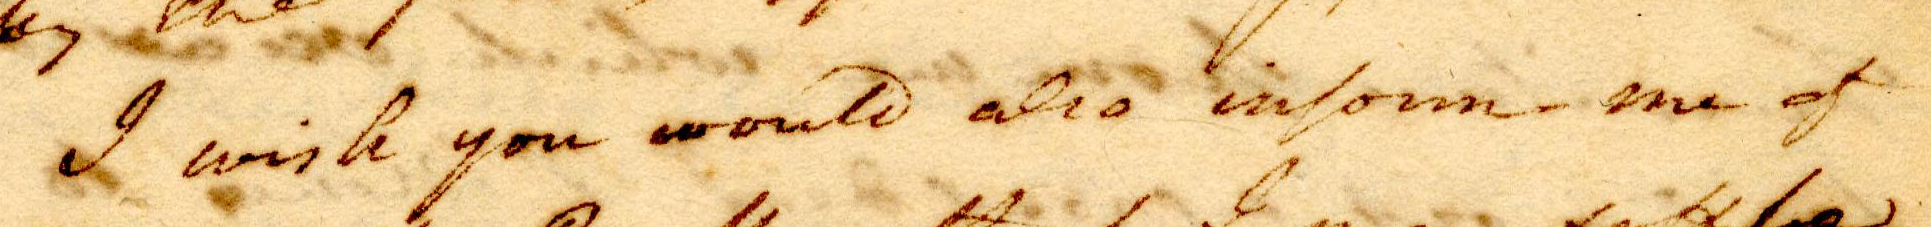I wish you would also inform me
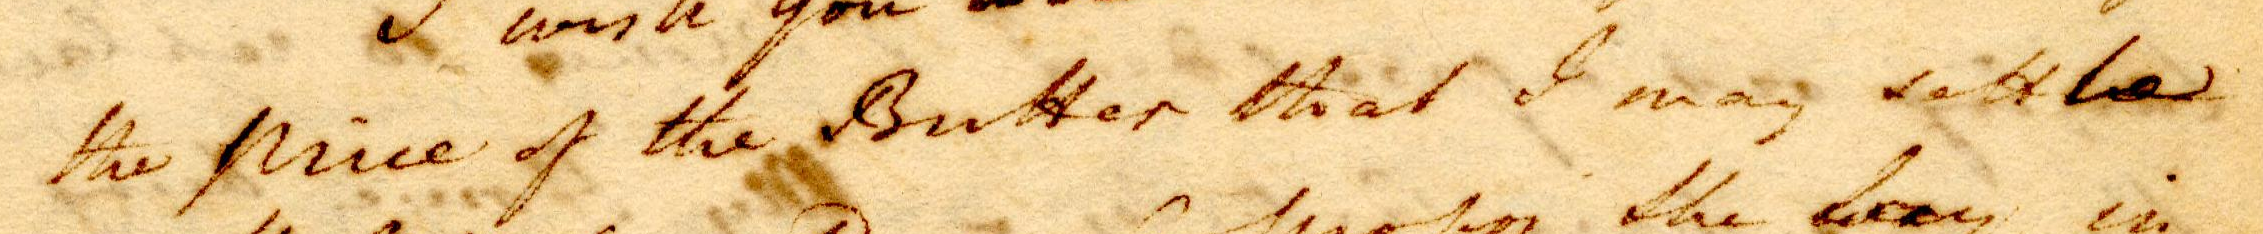the price of the Butter that I may settle
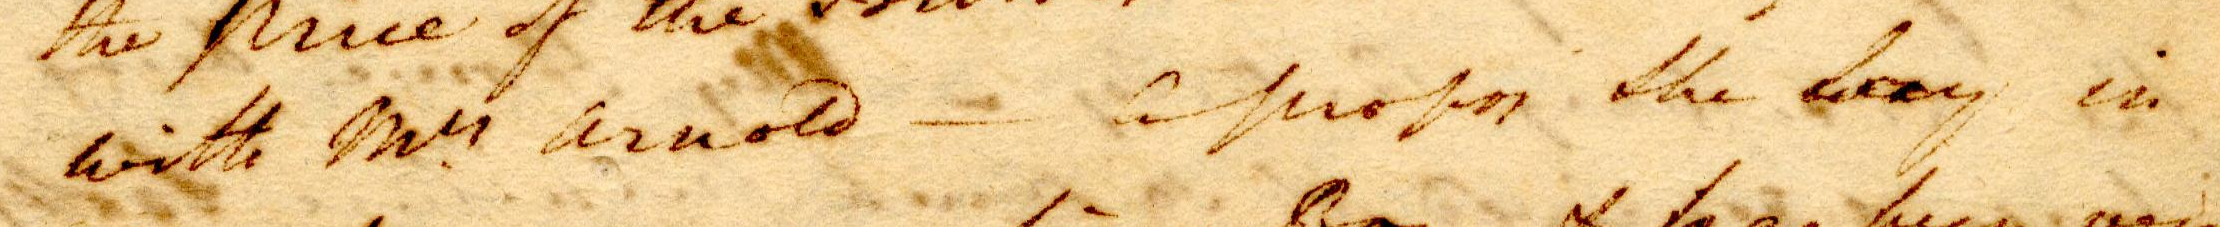with M^rs. Arnold. A propos she lay in
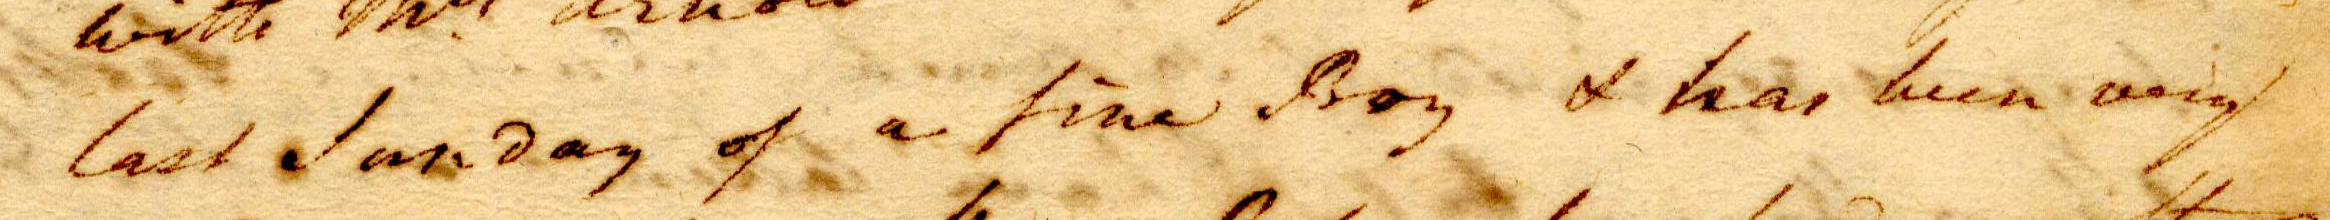last Sunday of a fine Boy & has been very
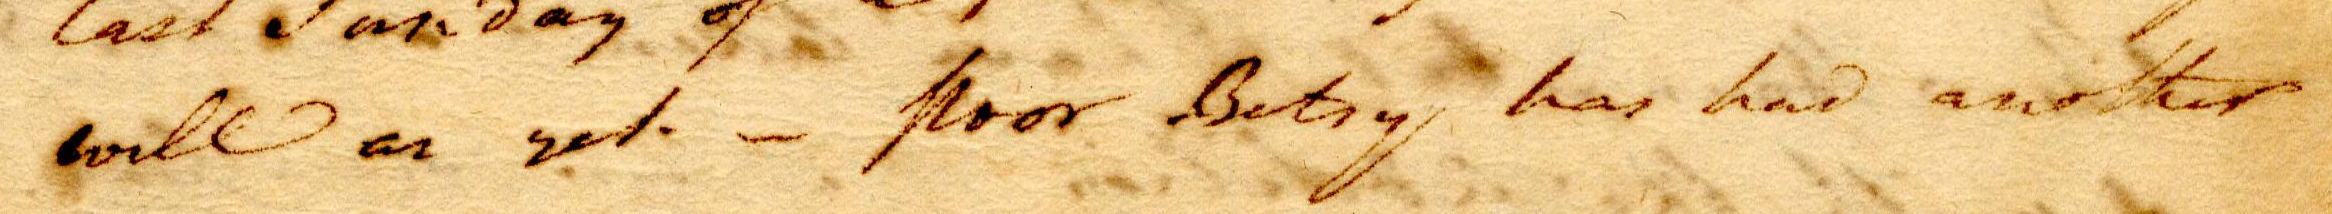well as yet. Poor Betsy has had another
